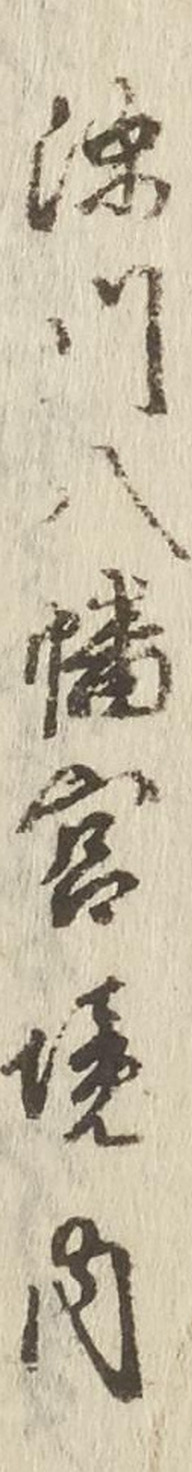深川八幡宮境内
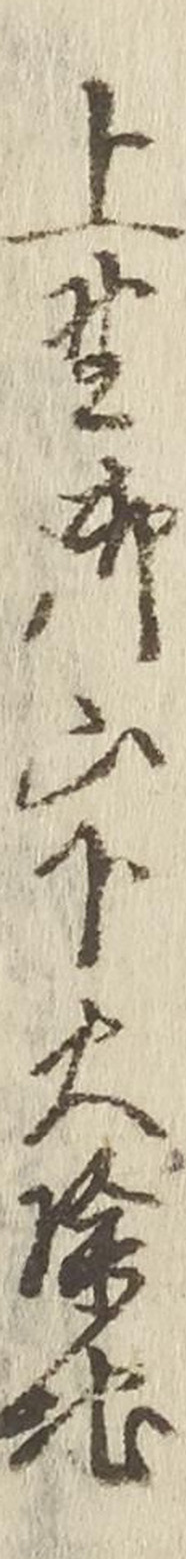上野御山下火除地
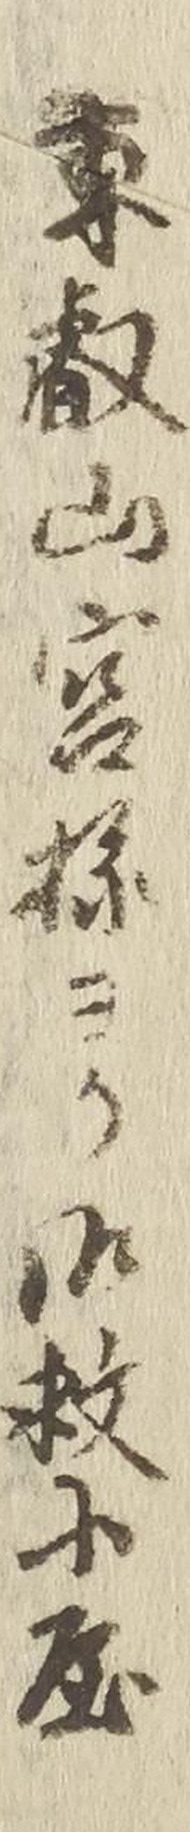東叡山宮様より御救小屋
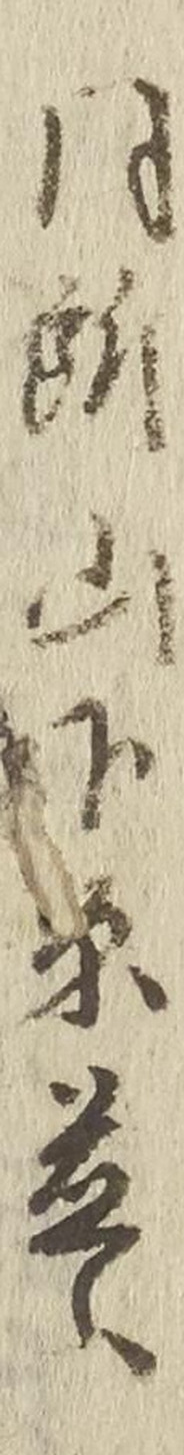同所山下原荒候

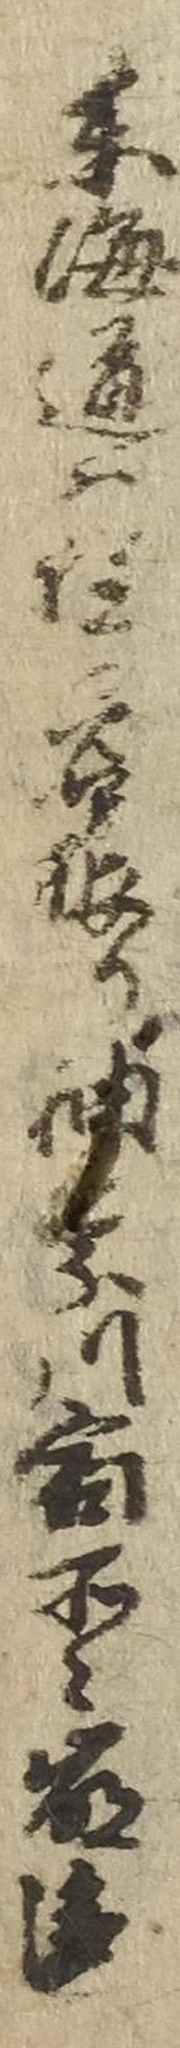東海道は程が谷限り神奈川宿所々崩多し
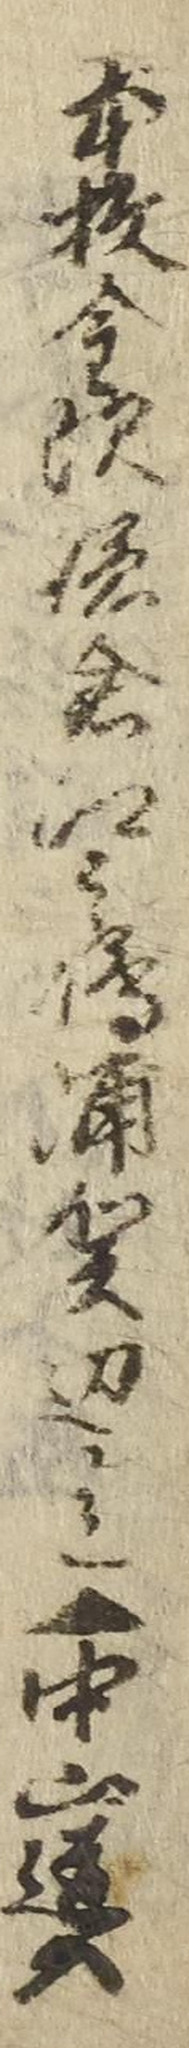本牧金沢鎌倉江の島浦賀辺迄▲中山道は
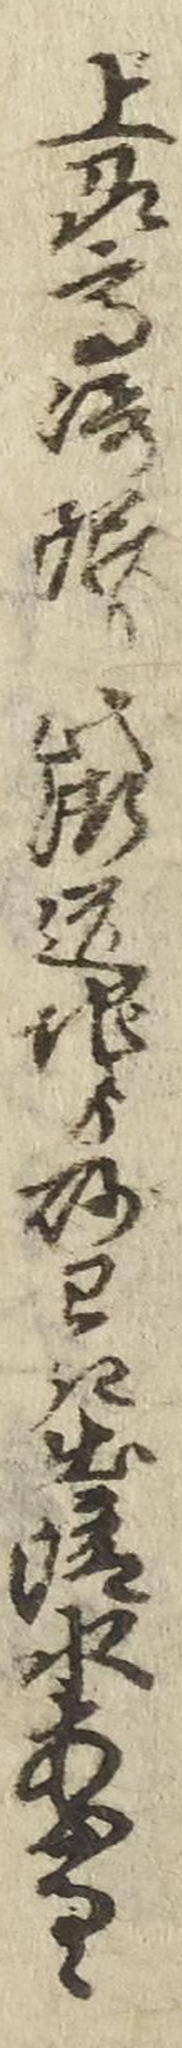上州高崎限り此街道地ゟ砂わき出清水あふるゝ
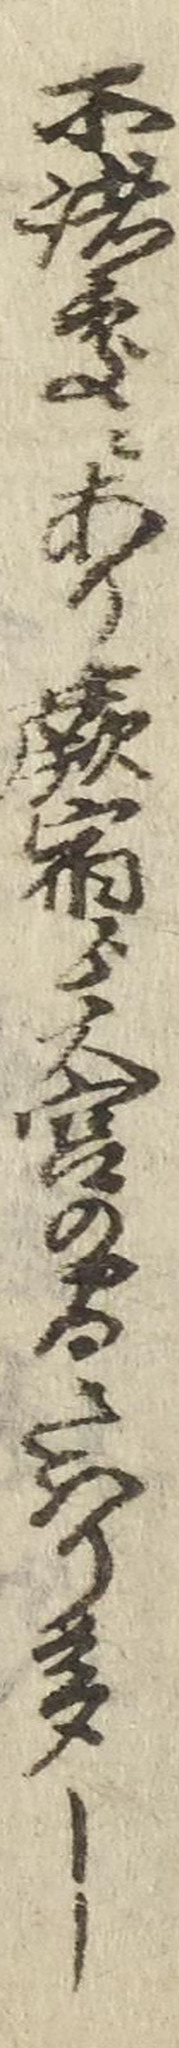所諸処にあり蕨宿ゟ大宮の間さわり多し
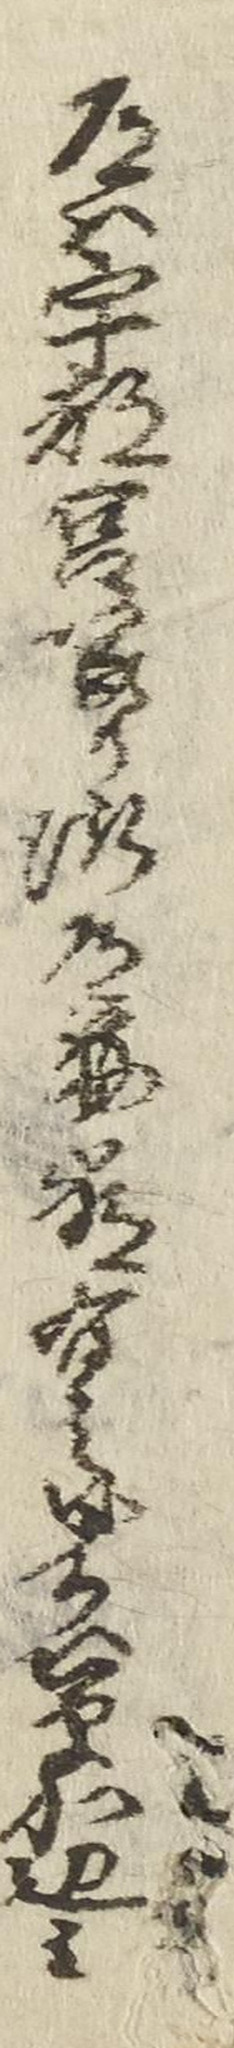道は宇都宮限り街道筋崩有之候またハ草加辺は
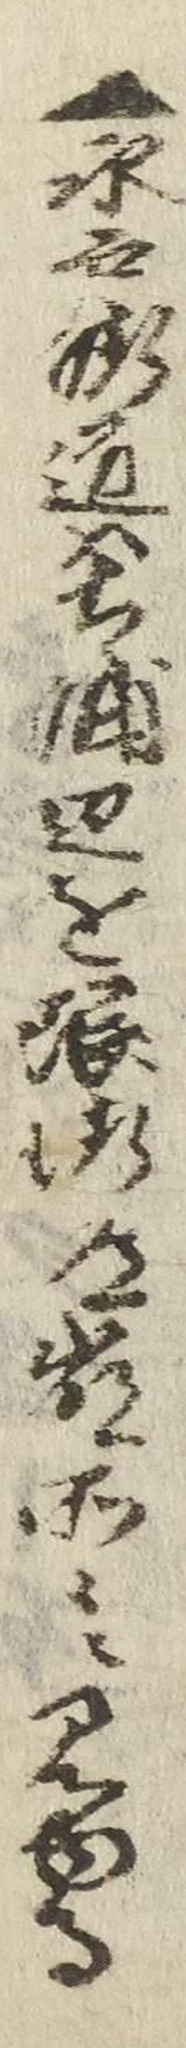▲水戸街道は土浦辺を限街道崩所々に見ゆる
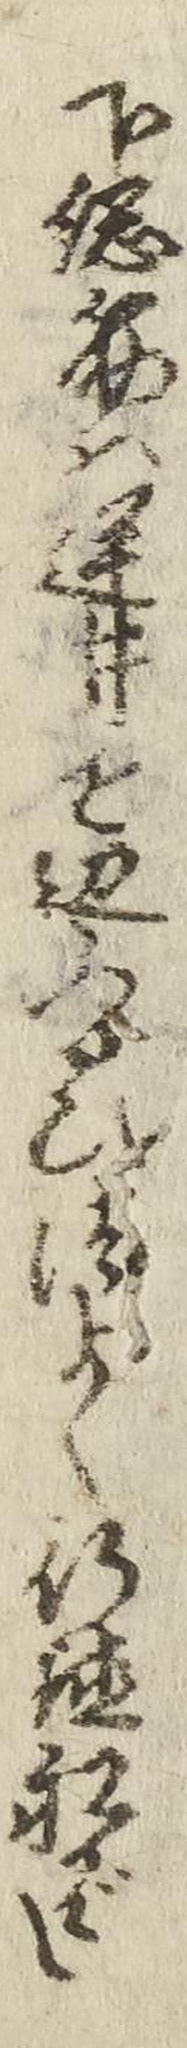下総筋は逆井近辺ふるひつよく行徳船ばし
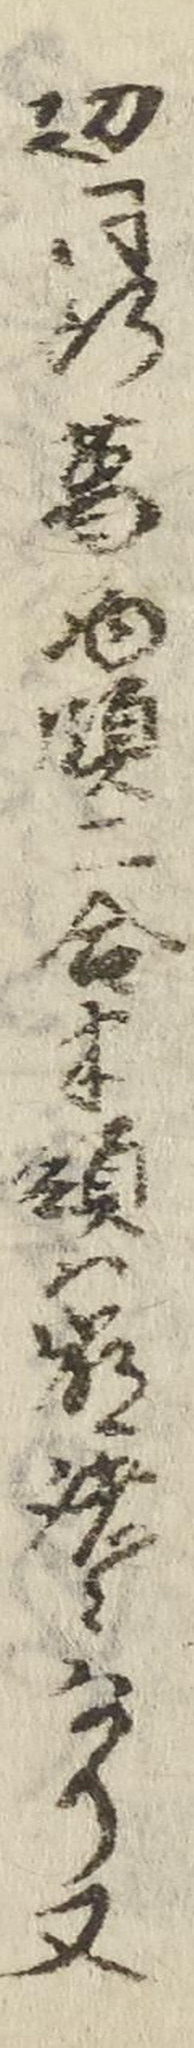辺同断葛西領二合半領は崩諸々なり又
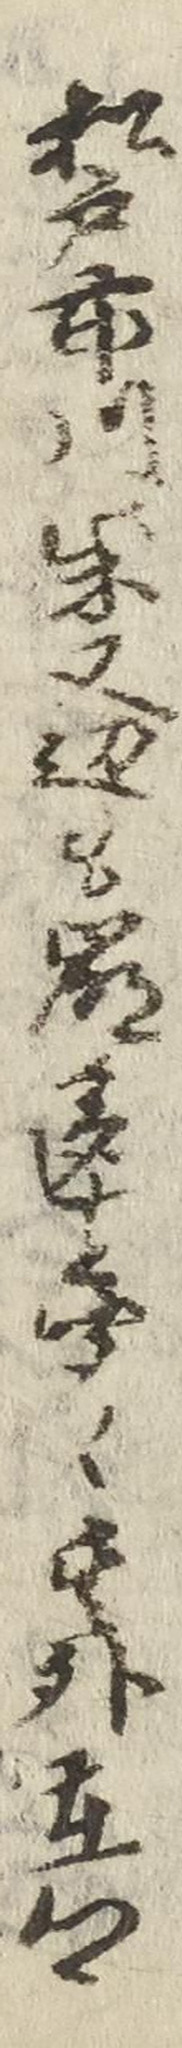松戸市川柴又辺も崩多しと聞く其外在郷
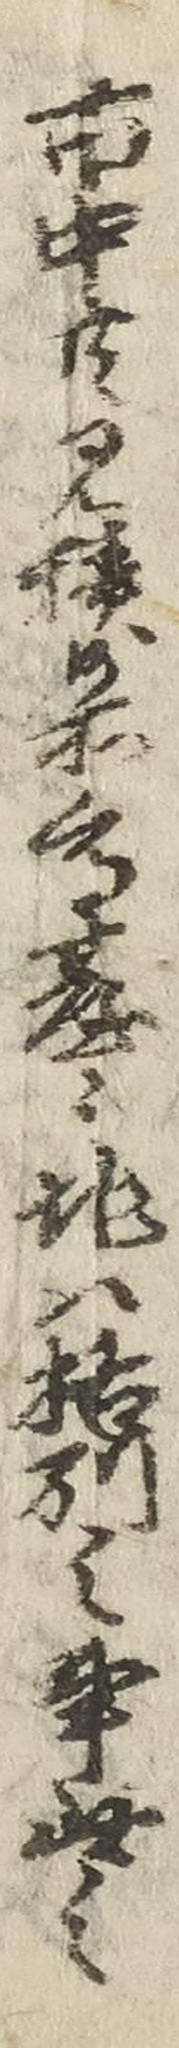市中共見積候所高台之地は格別の事無之
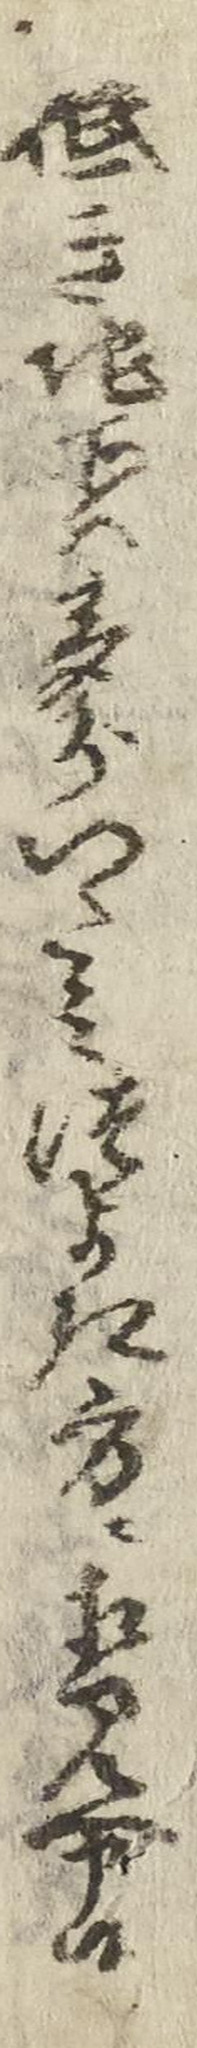低き地所は多分いたみつよき方に相見へ申候
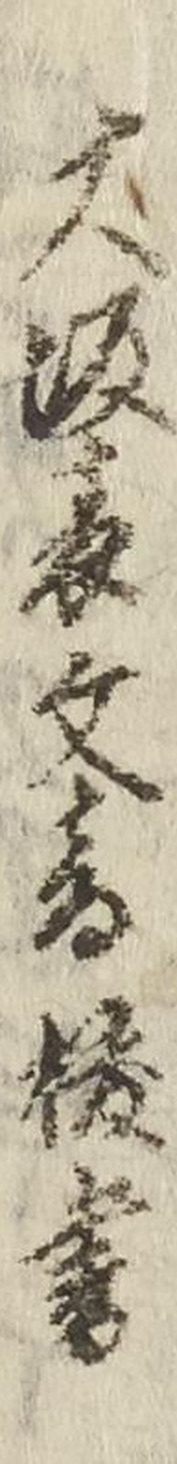大坂表文音抜書
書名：地震出火　男女死人怪我人書上之寫
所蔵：東京大学地震研究所図書室 Earthquake Research Institute Library, The University of Tokyo, JAPAN
